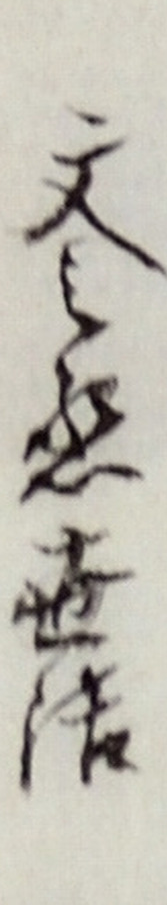文之丞世話
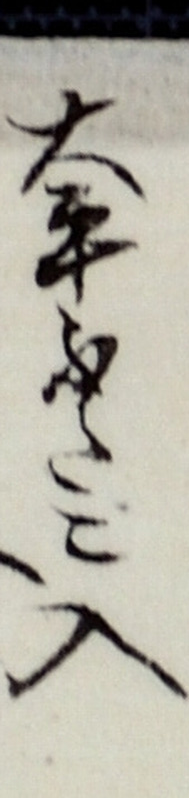大平ふたこ入
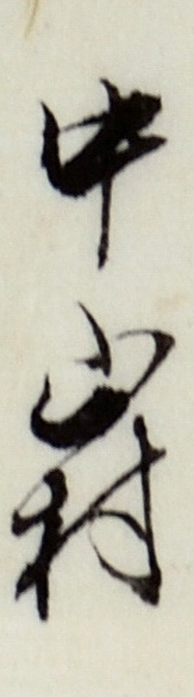中山村
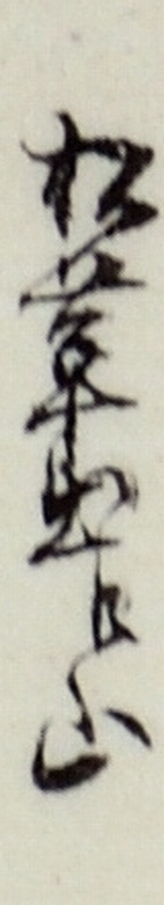松茸出候山
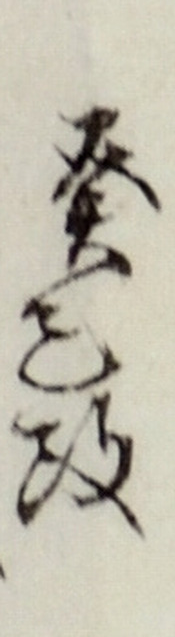癸巳改
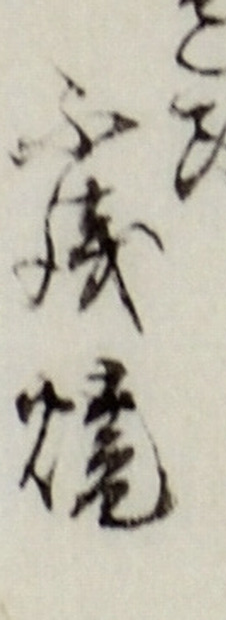不残焼
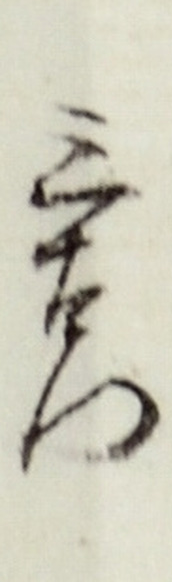三右衛門

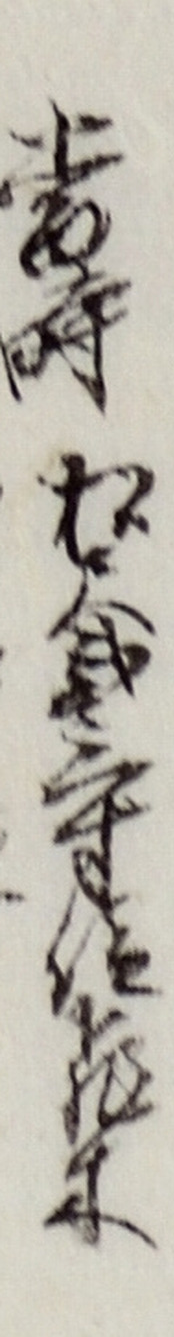当時松尺弐三寸位飛木
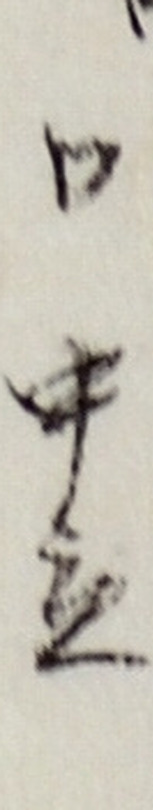同中立
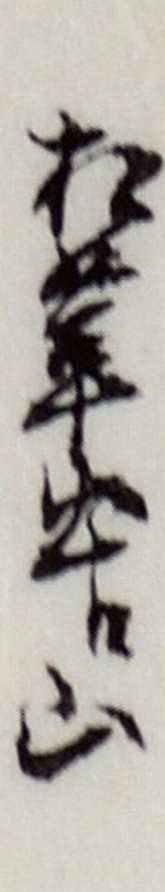松茸出候山
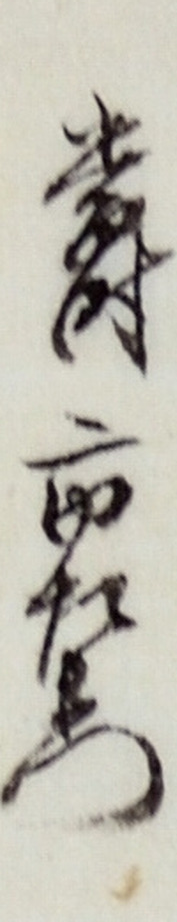当時市左衛門
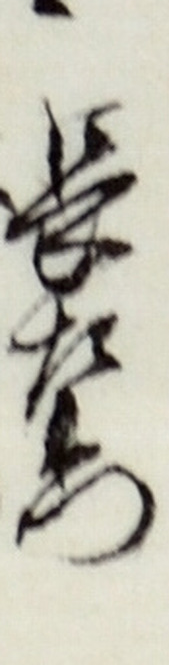六左衛門
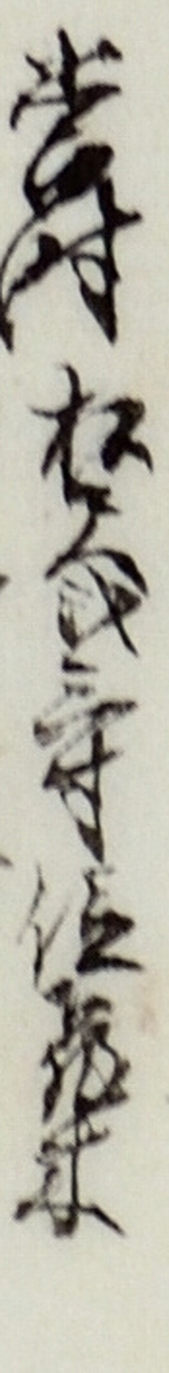当時松尺弐三寸位飛木
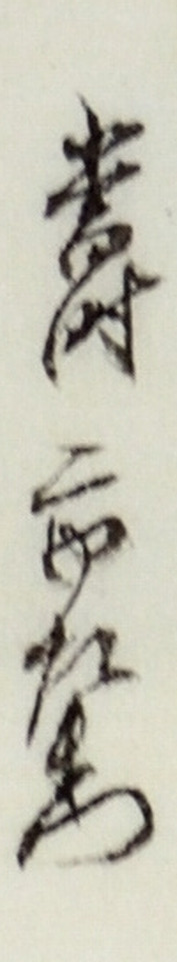当時市左衛門
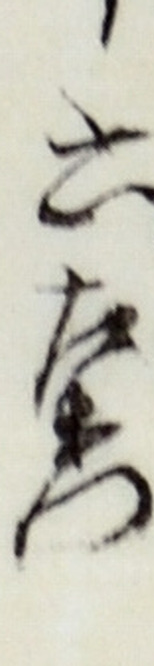六左衛門
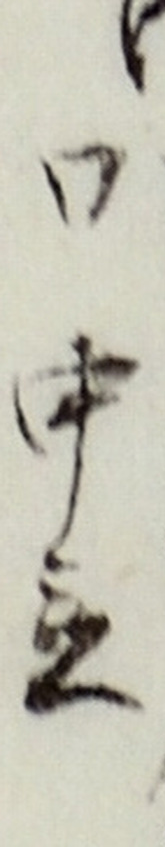同中立
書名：山林帳草稿
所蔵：伊那市立高遠町図書館・合同会社AMANE
